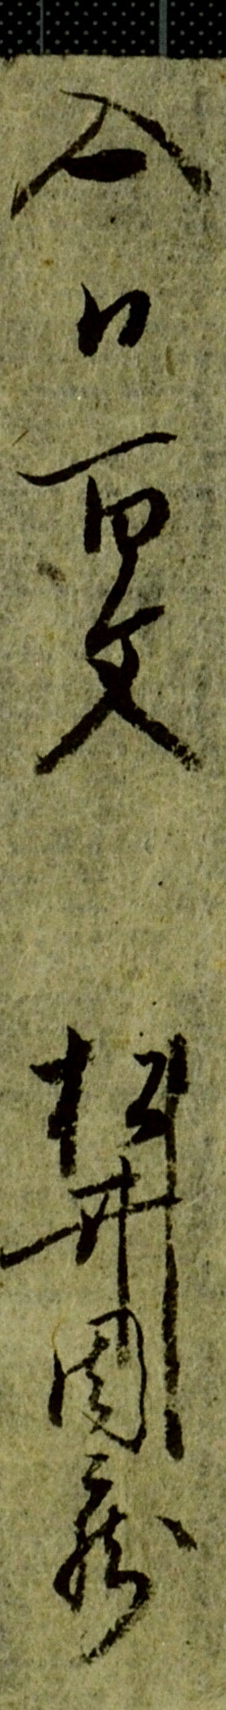一同百文松井周蔵
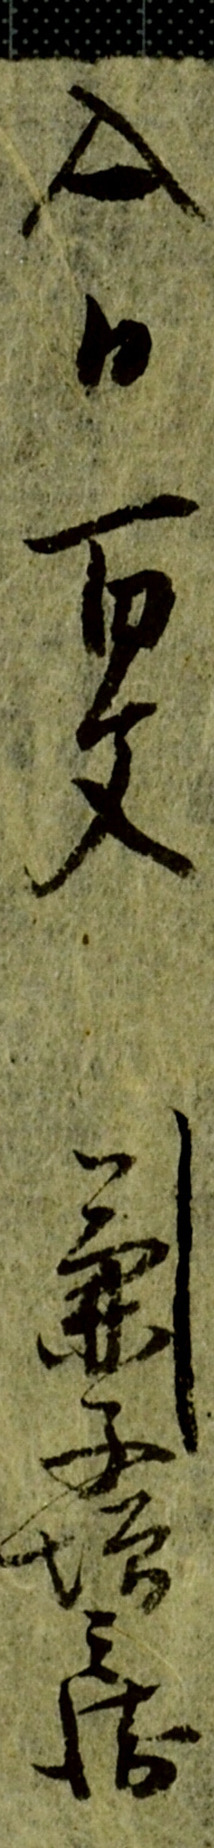一同百文兼子増兵衛
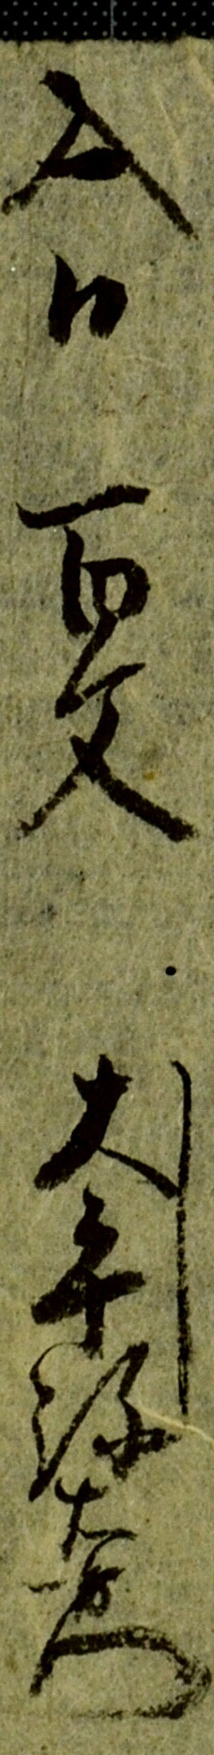一同百文大平弥右衛門
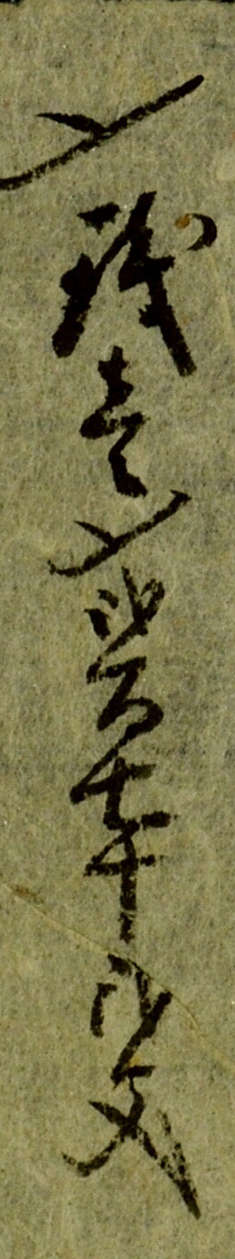〆銭壱〆弐百七十弐文
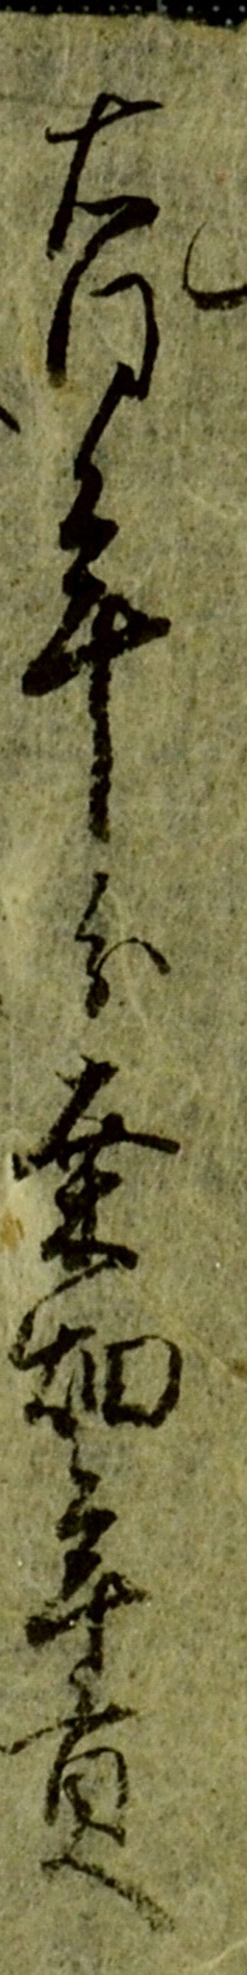右同年分桑畑年貢
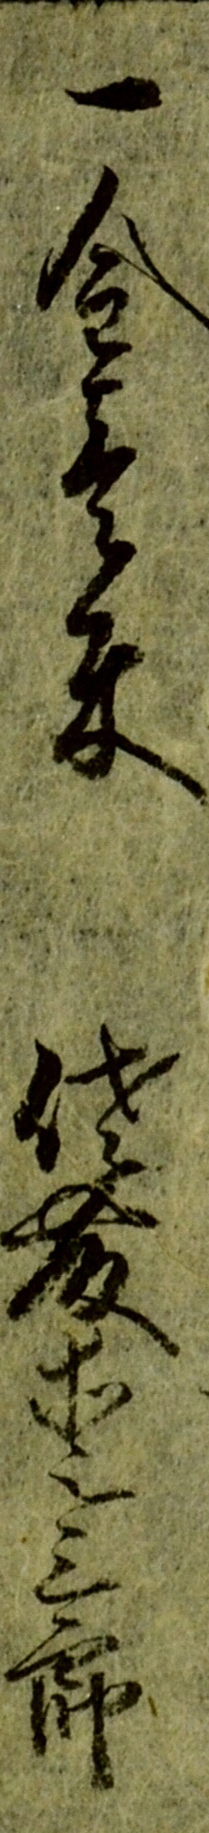一金壱朱佐藤愛三郎
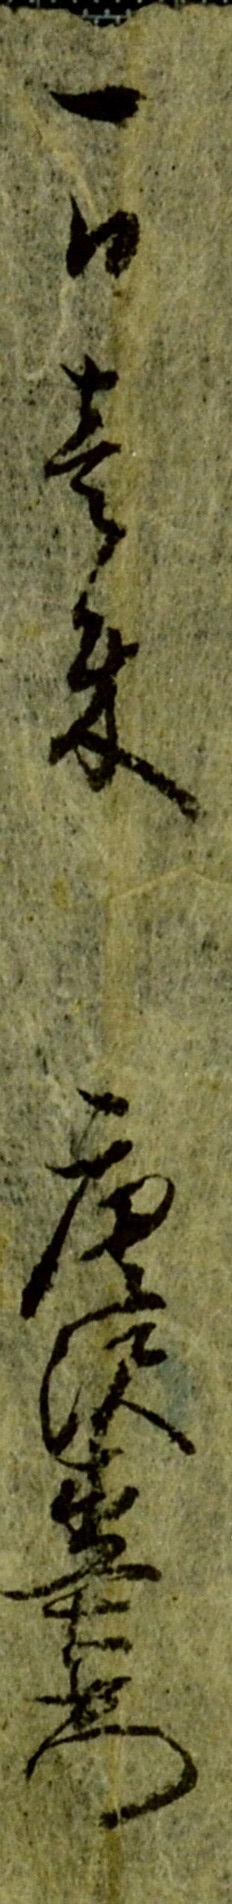一同壱朱唐沢杢右衛門

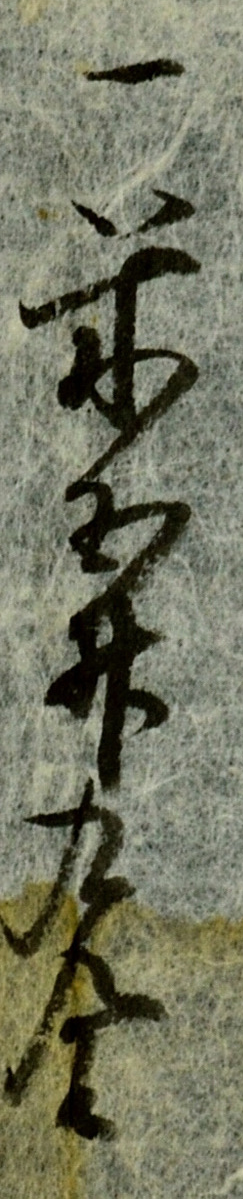一米五升九合
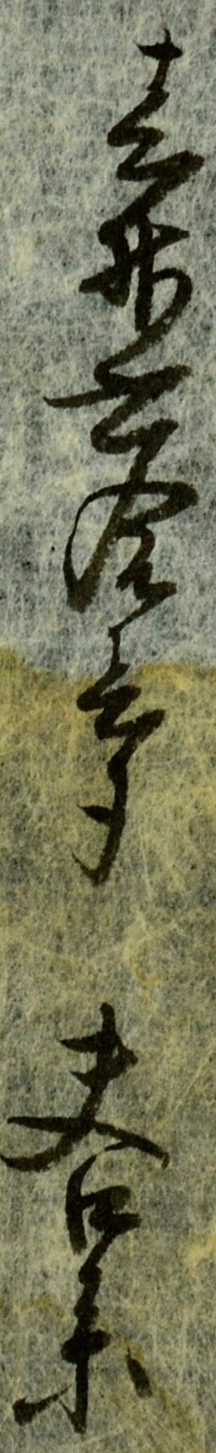壱升六合壱勺夫口米
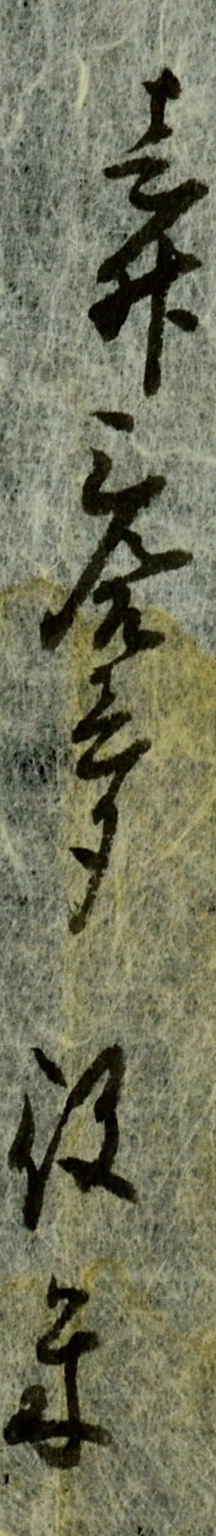壱升三合壱勺役米
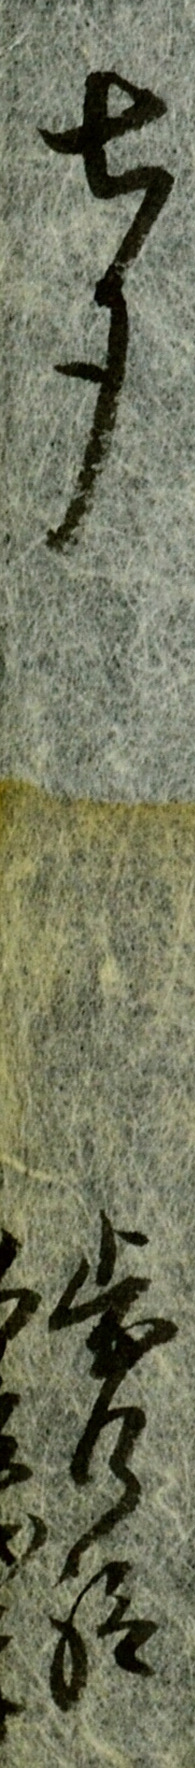七勺歩行給
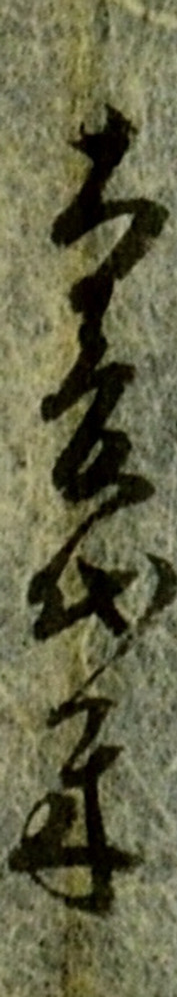大麦代米
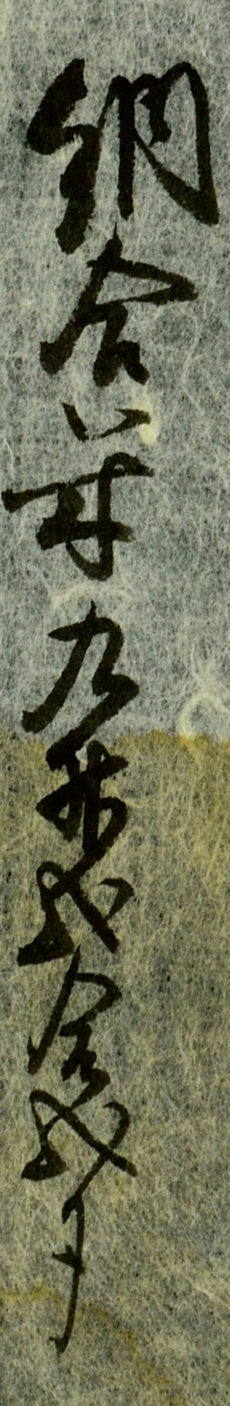納合米九升弐合弐勺
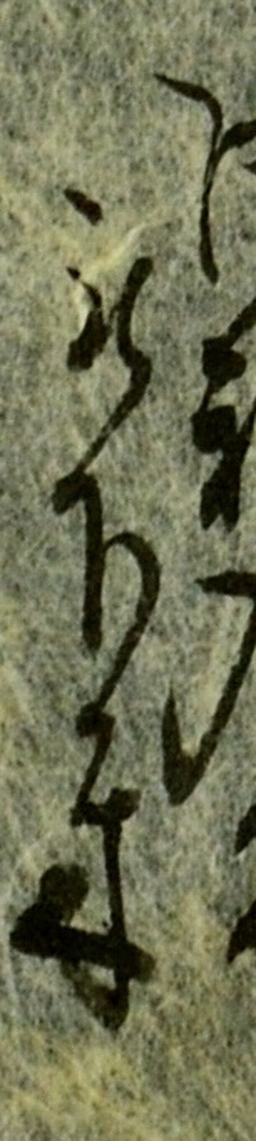被下米
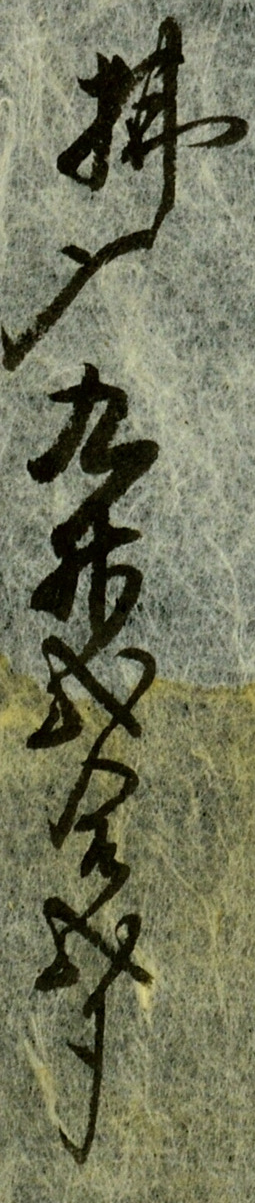払〆九升弐合弐勺
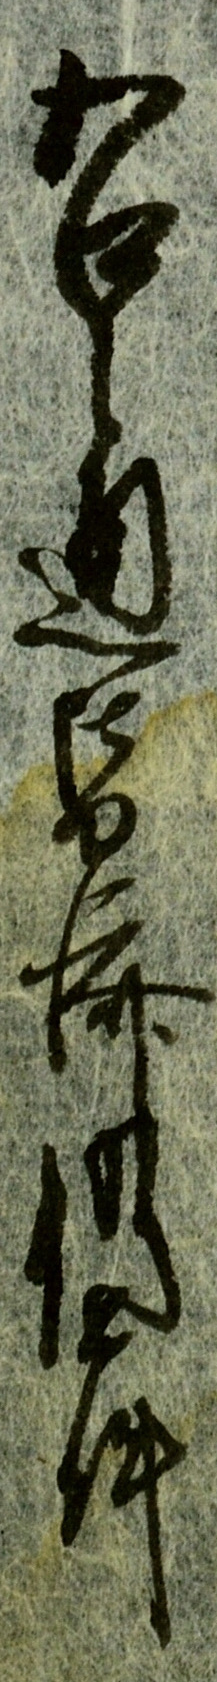右之通皆済仍如件
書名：覚
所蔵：伊那市立高遠町図書館・合同会社AMANE
